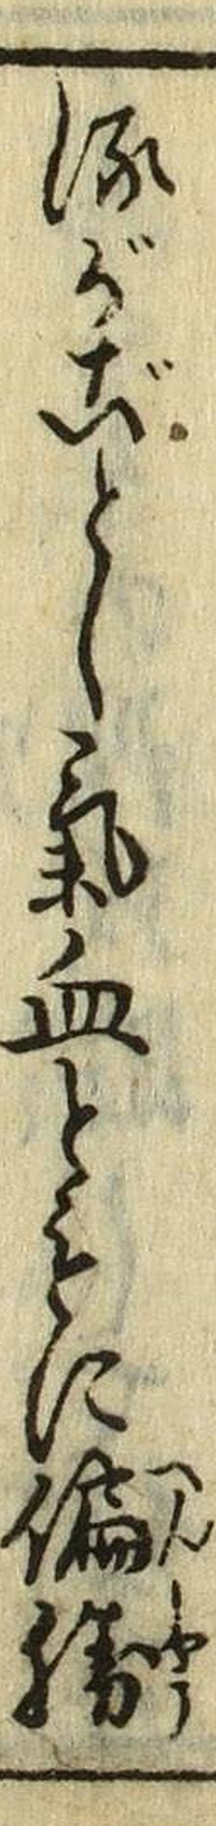るがごとし気血ともに偏勝
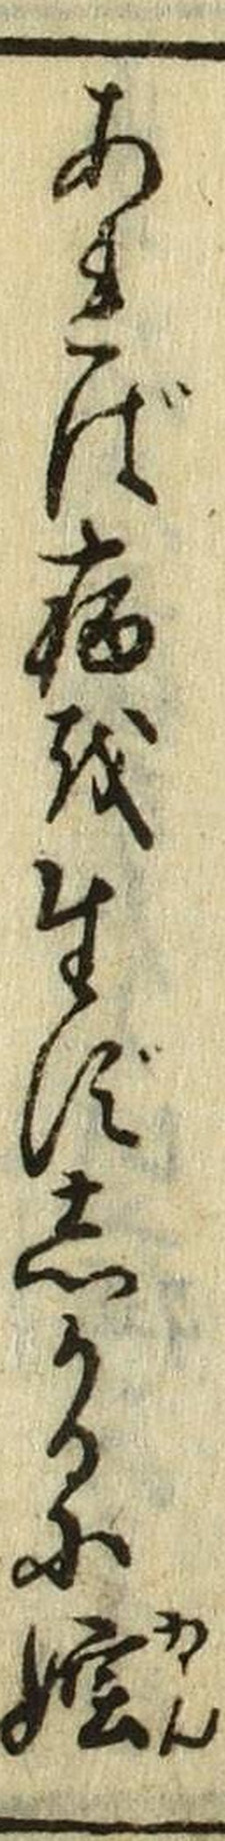あれば病を生ずしかるに婬
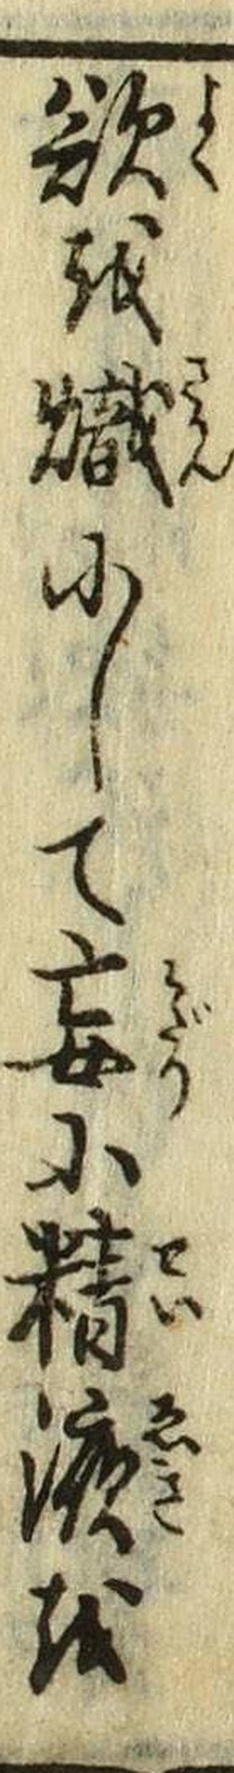欲を熾にして妄に精液を
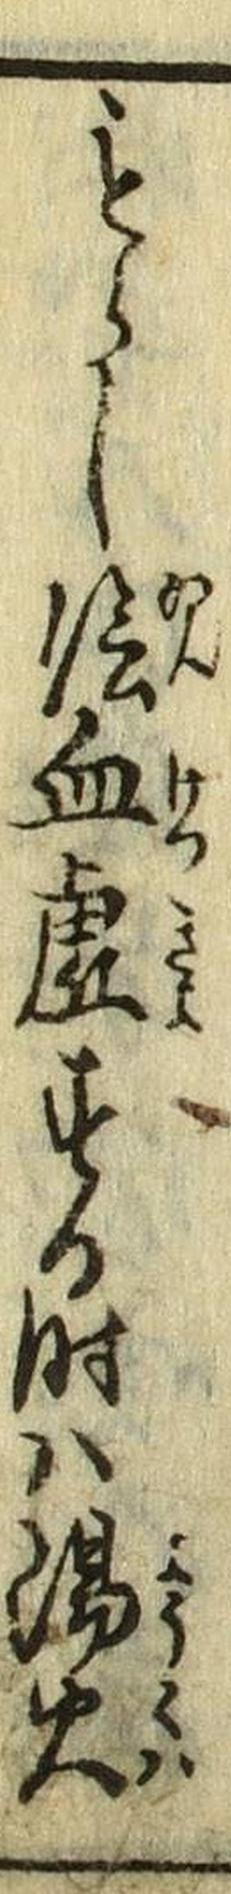もらし陰血虚する時は陽火
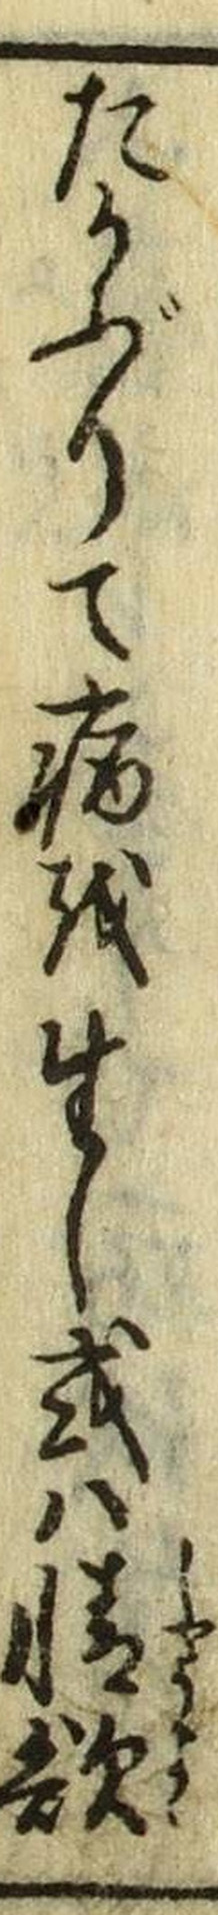たかぶりて病を生し或は情欲
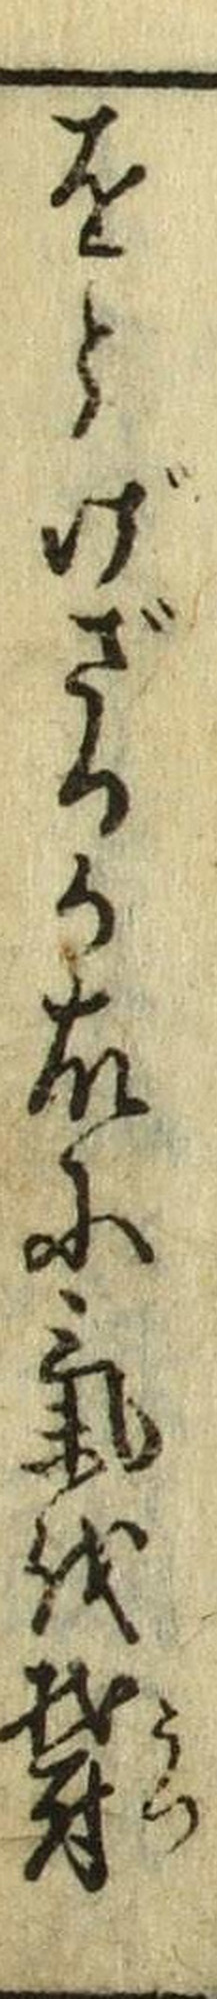をとげざるか故に気を鬱

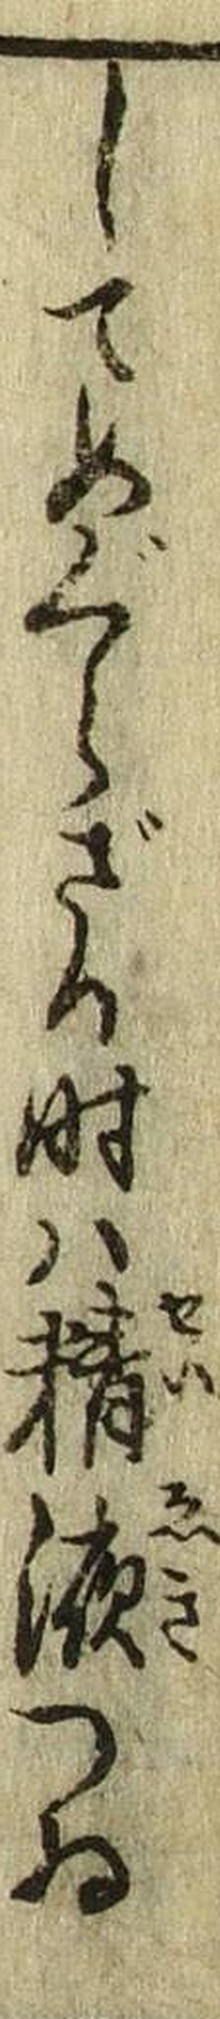してめぐらざる時は精液つゐ
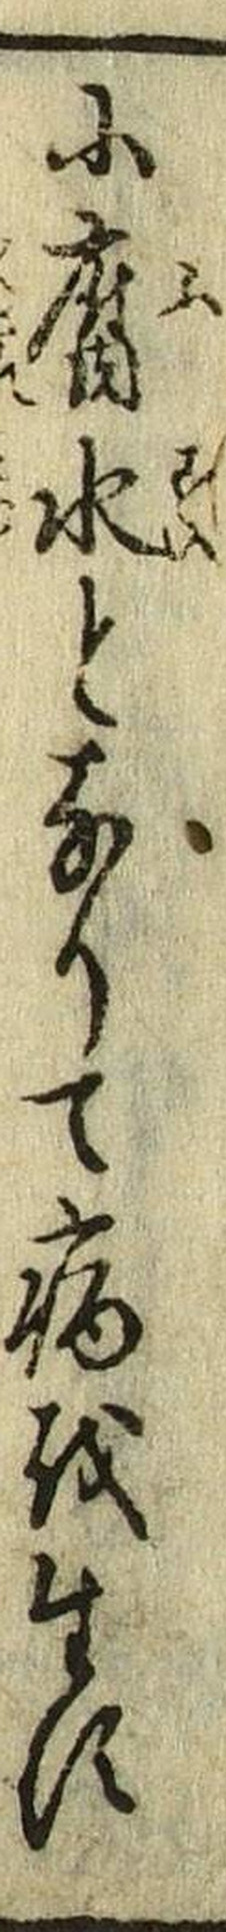に腐水となりて病を生す
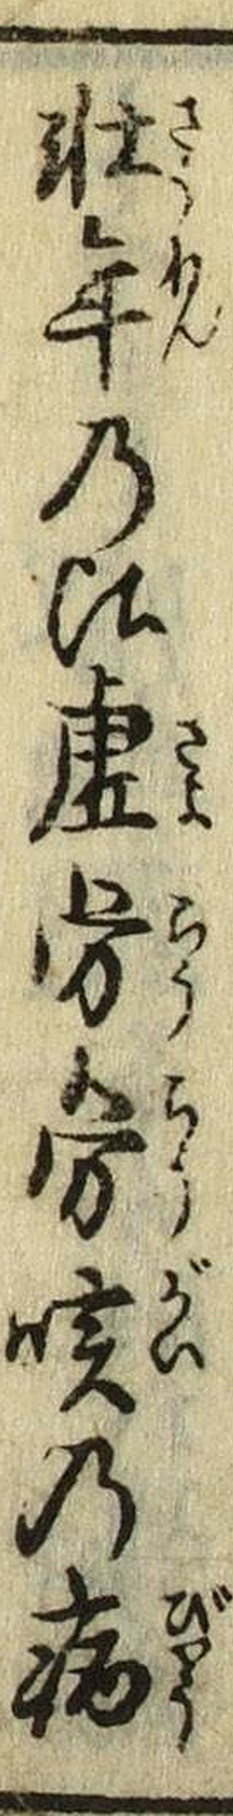壮年の比虚労労咳の病
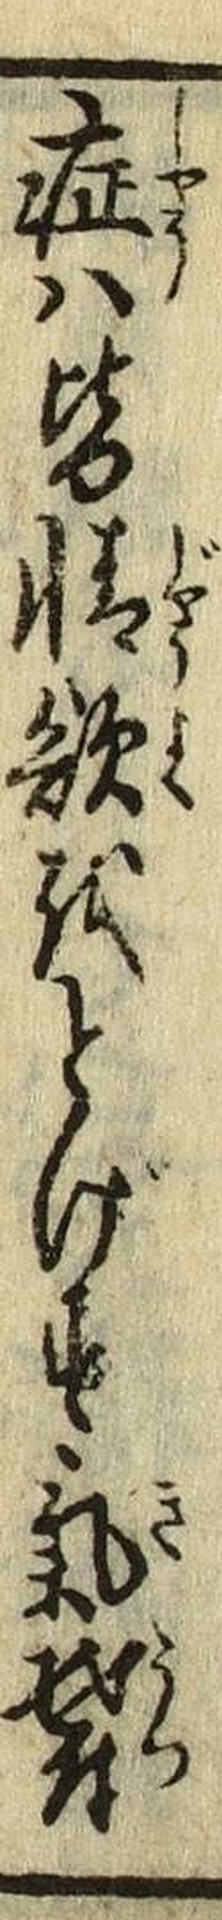症は皆情欲をとげす気鬱
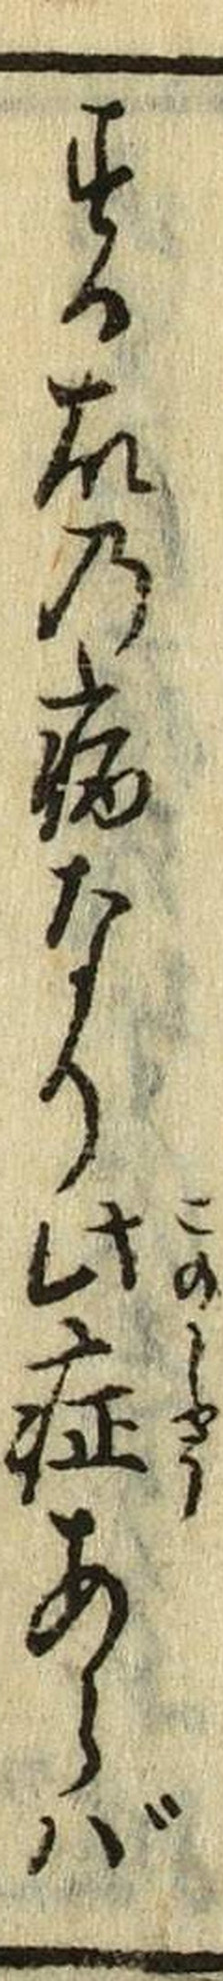する故の病なり此症あらば
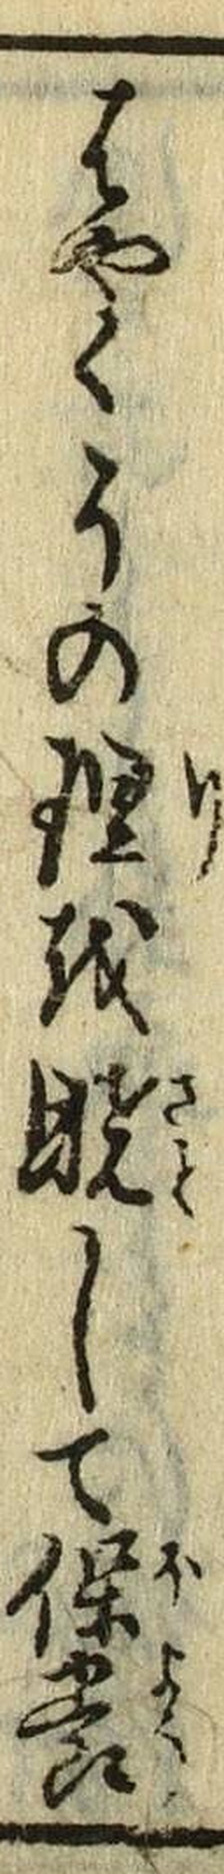はやくその理を暁して保養
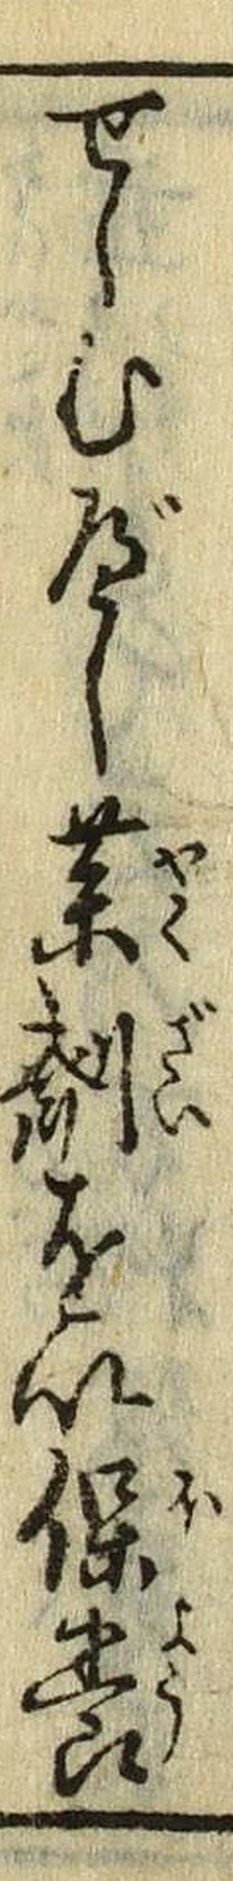せしむべし薬剤を以保養
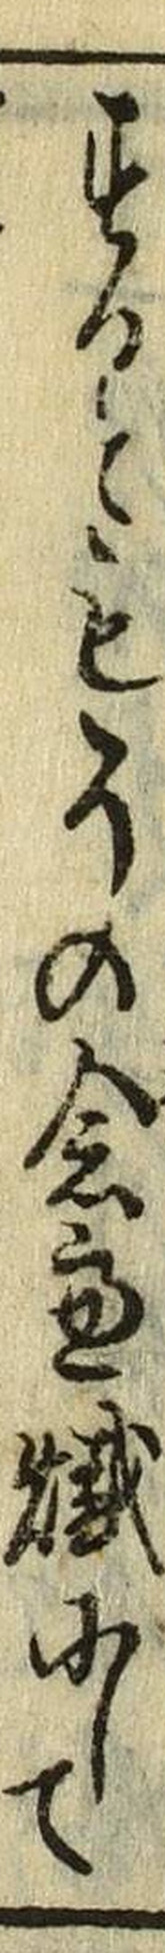するともその念慮熾にして
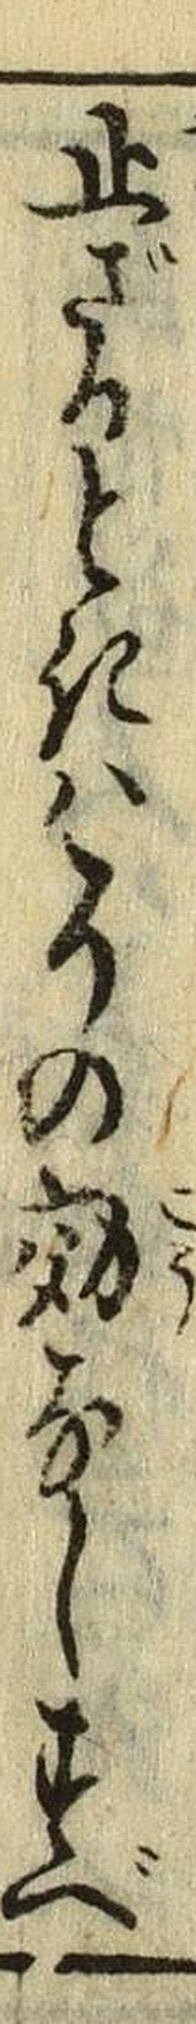止ざるときはその効なしすべ
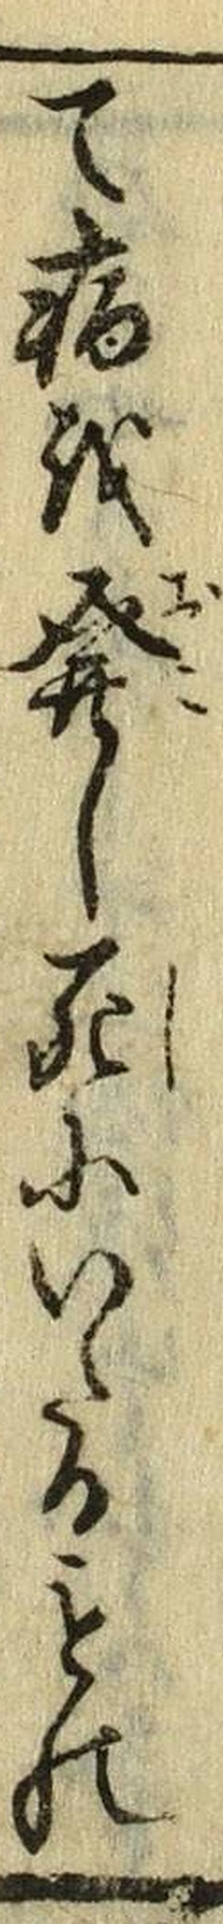て病を発し死にいたるもの
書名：居家養生記
